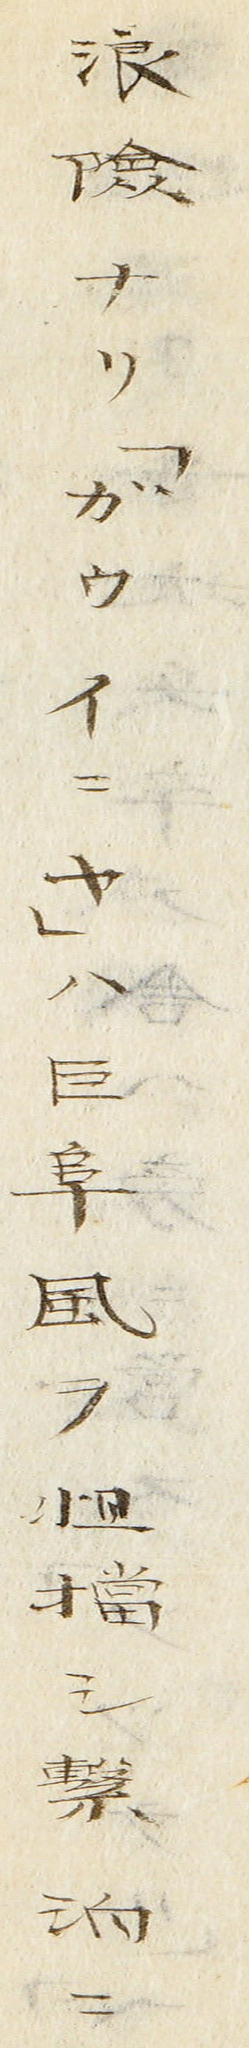浪険ナリ「ガウイニヤ」ハ巨阜風ヲ阻擋シ繋泊ニ
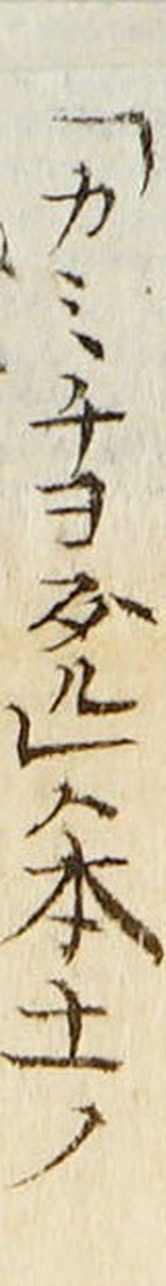「カミチヨダル」ハ本土ノ
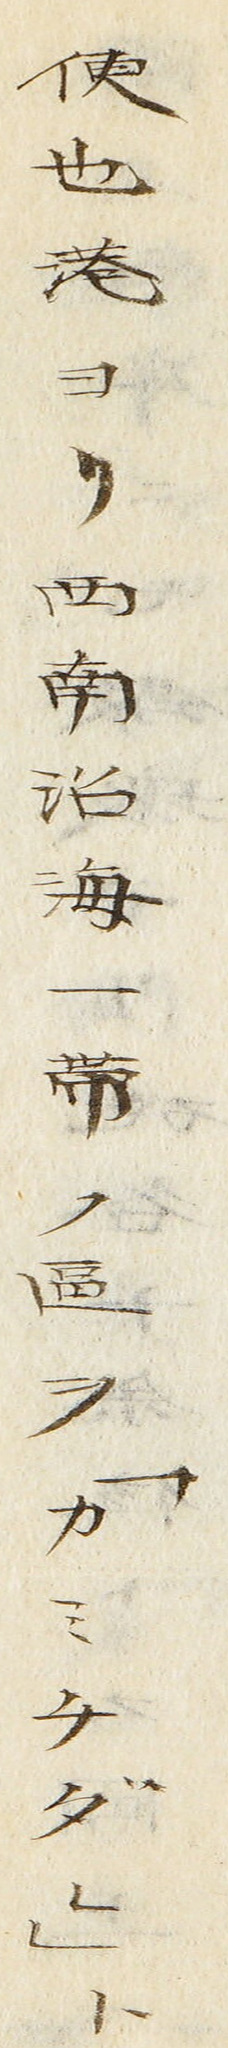※便也港ヨリ西南沼海一帯ノ區ヲ「カミチダレ」ト
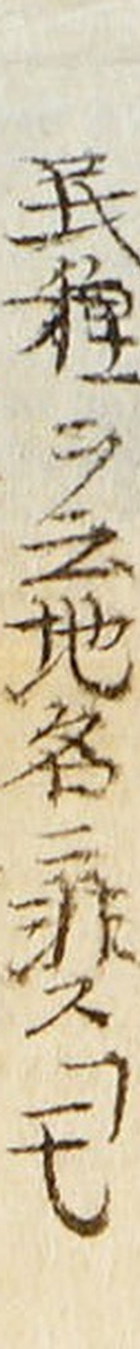民種ヲ云地名ニ非ス「モ
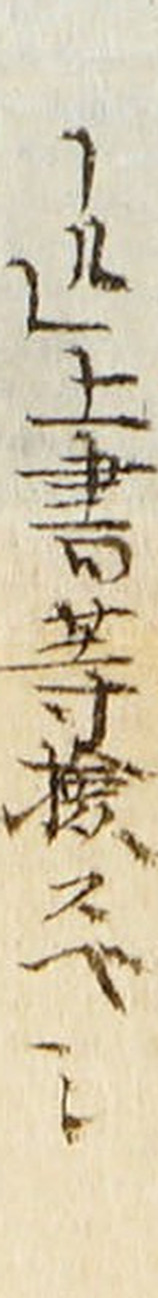－ル」上書等検スベシ
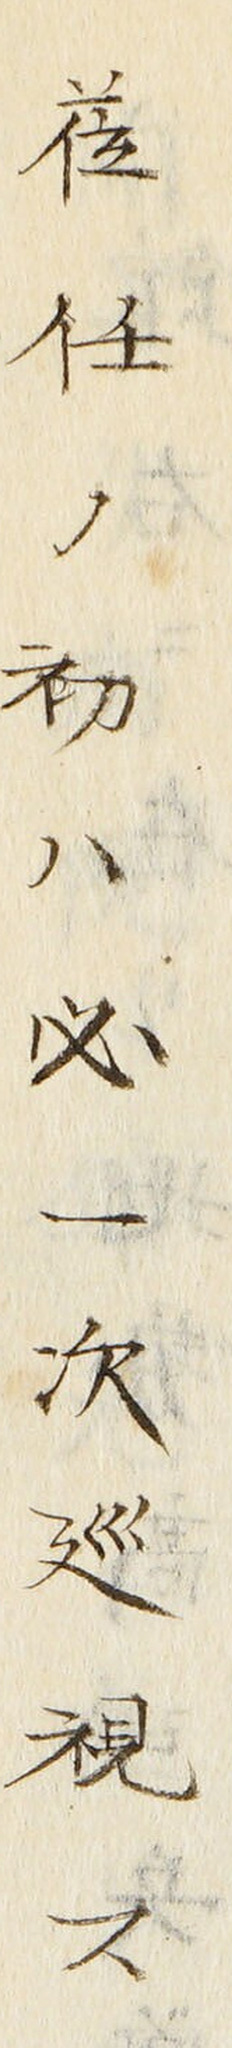莅任ノ初ハ必一次巡視ス
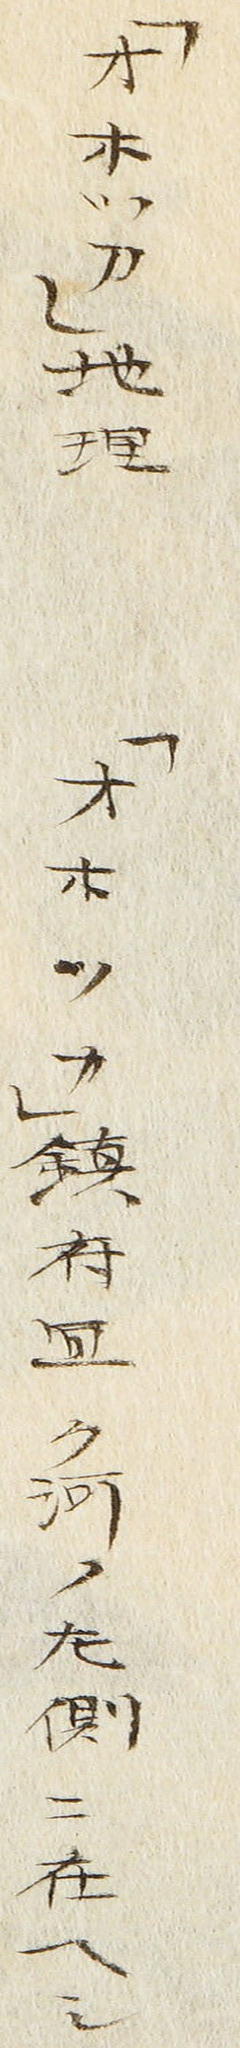「オホツカ」地理「オホツカ」鎮府宜ク河ノ左側ニ在ヘシ
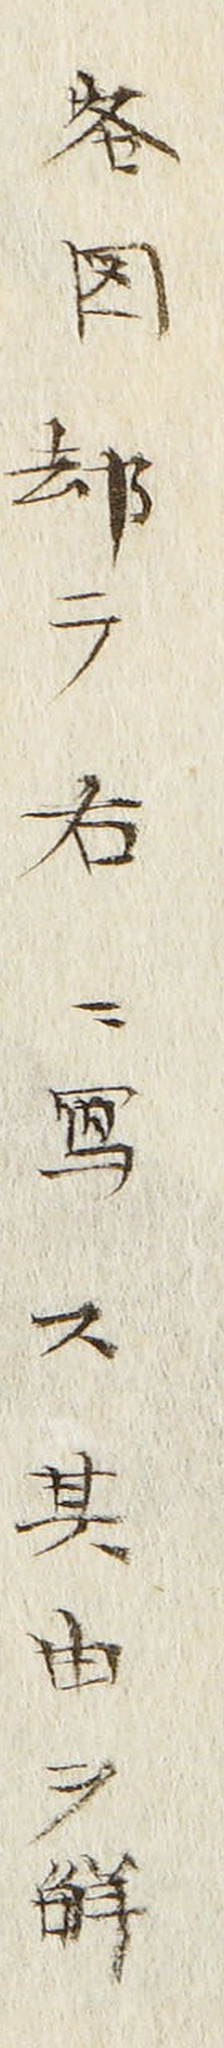客図却テ右二寫ス其由ヲ觧
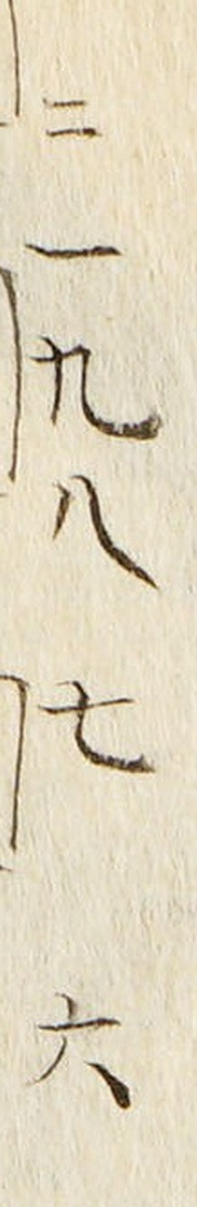二一九八七六

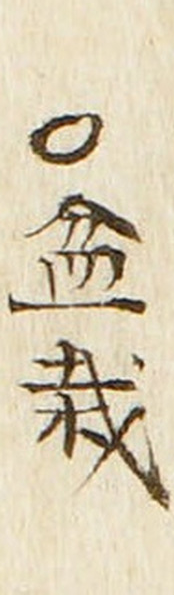〇盆栽
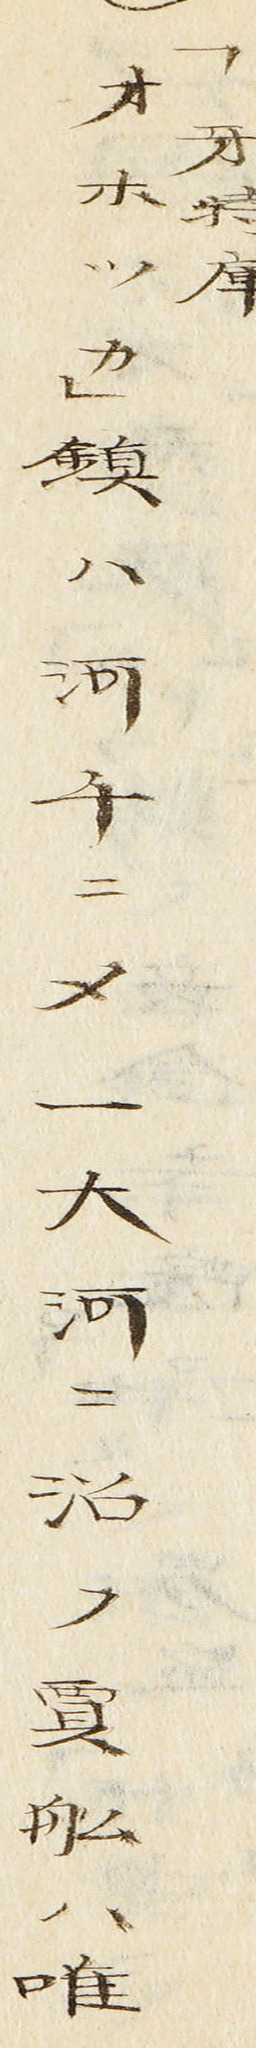〇「オホツカ」鎮ハ河千ニシテ一大河ニ沿フ賈舩ハ唯
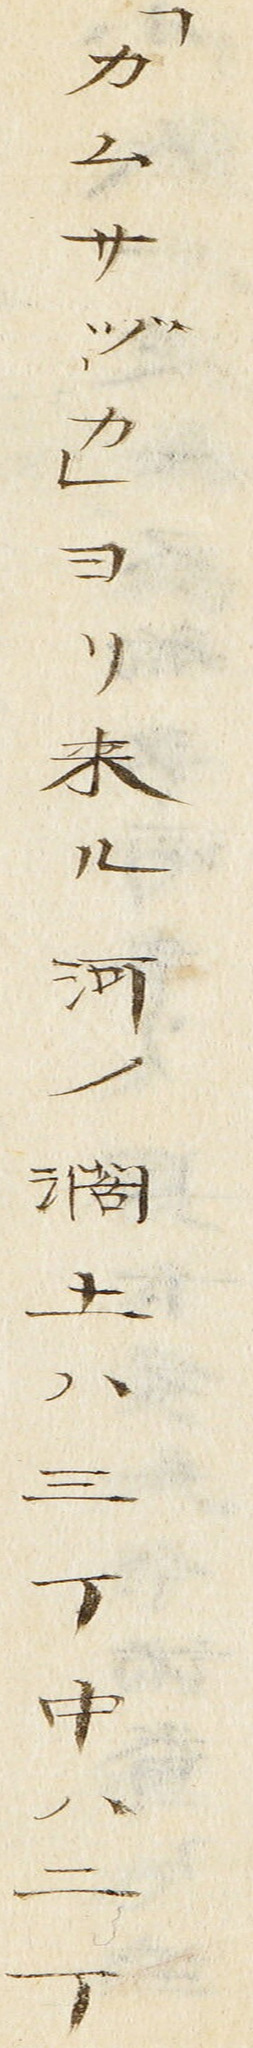「カムサヅカ」ヨリ来ル河ノ濶土ハ三丁中ハ二丁
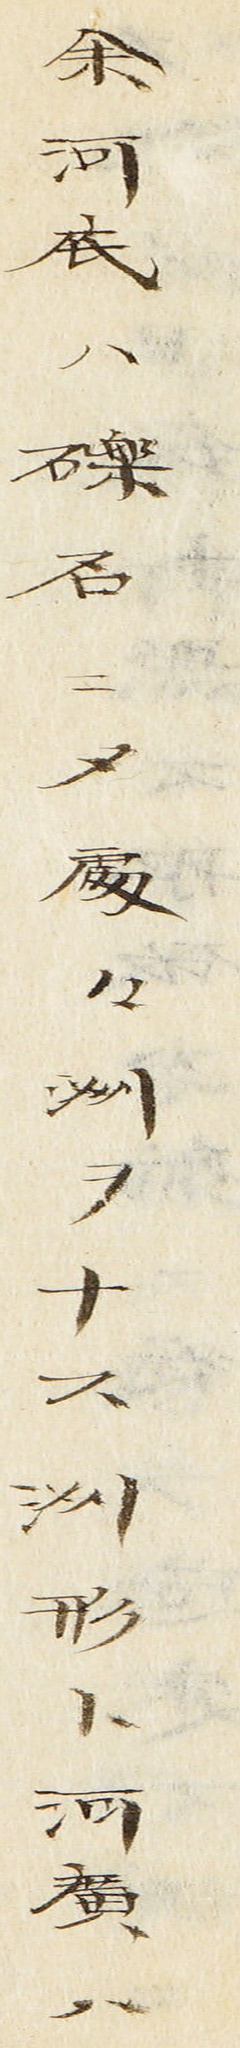余河底ハ礫石ニシテ處々洌ヲナス洌形ト河廣ハ
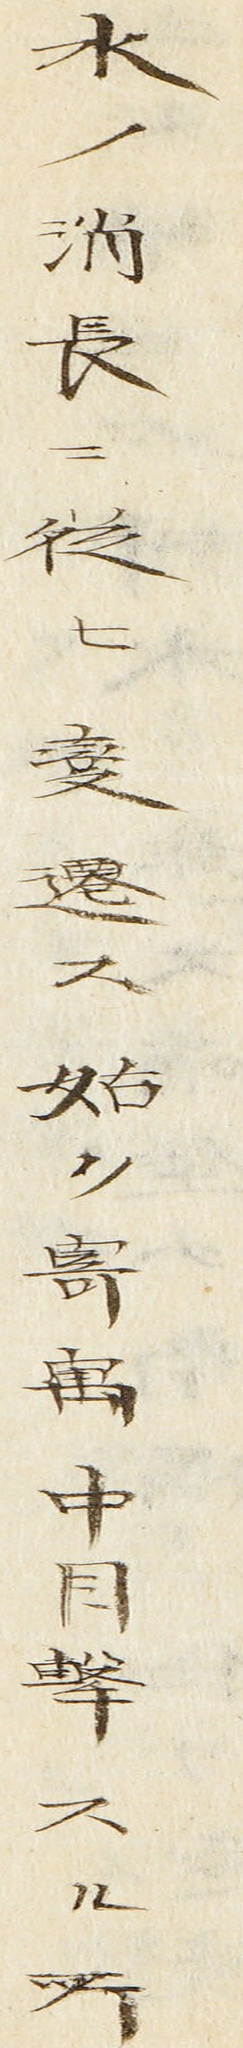水ノ消長ニ従ヒ變遷ス姑ク寄寓中目撃スル所
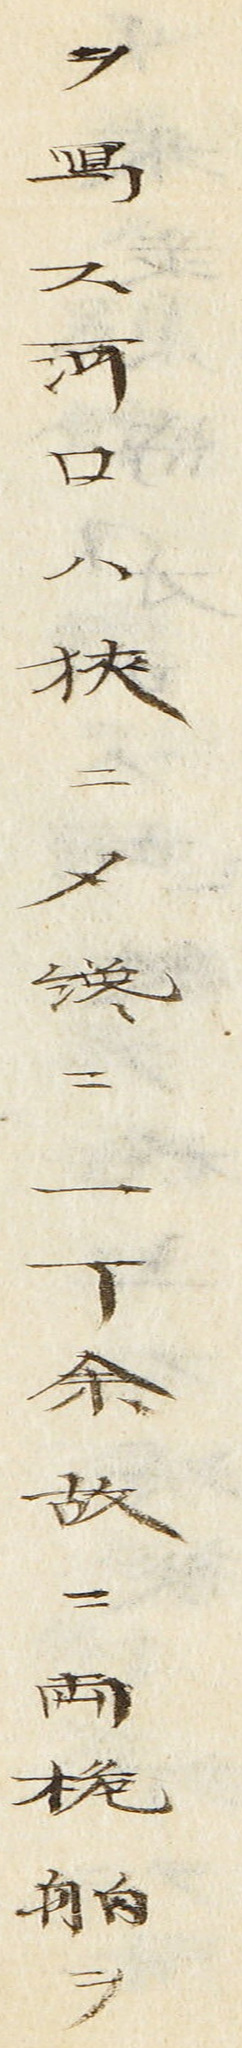ヲ寫ス河口ハ狭ニシテ讒ニ一丁余故ニ両桅舶ヲ
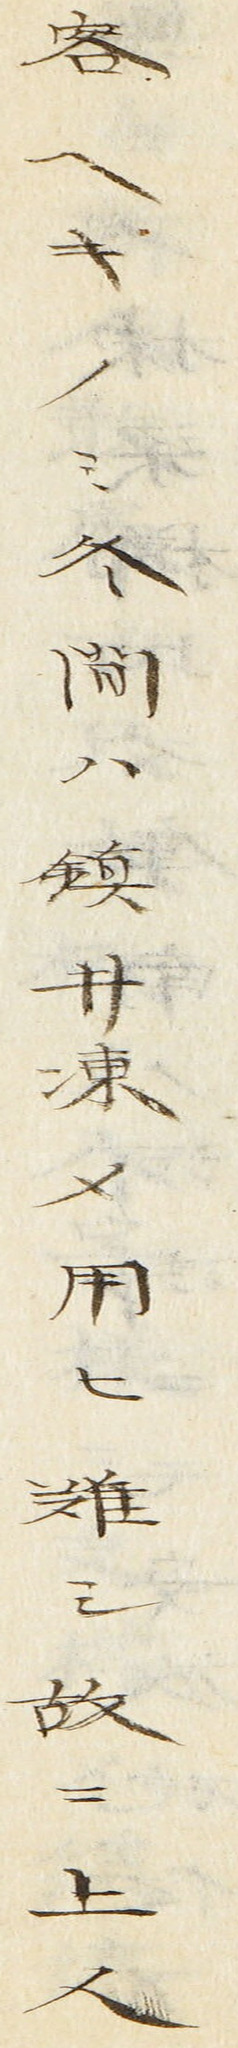客ヘキノミ冬間ハ鎮井凍シテ用ヒ難シ故二上人
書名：蕃談
